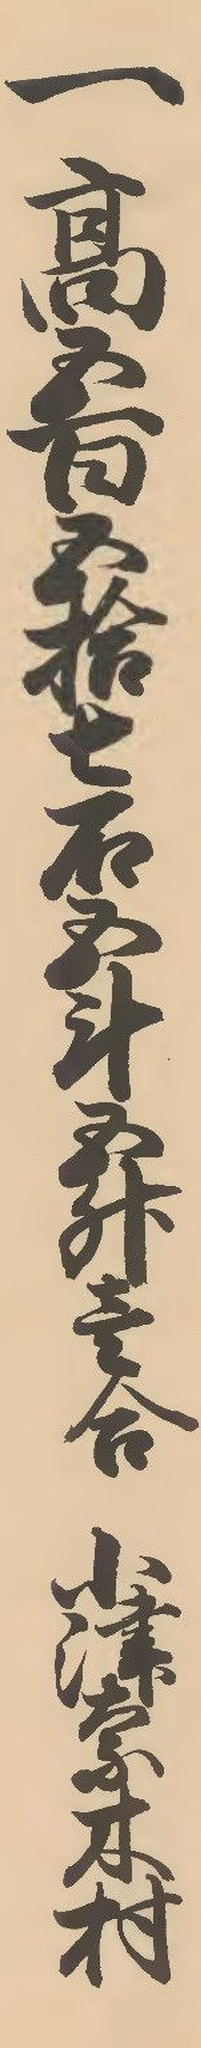一髙五百五拾七石五斗五升壱合小津奈木村
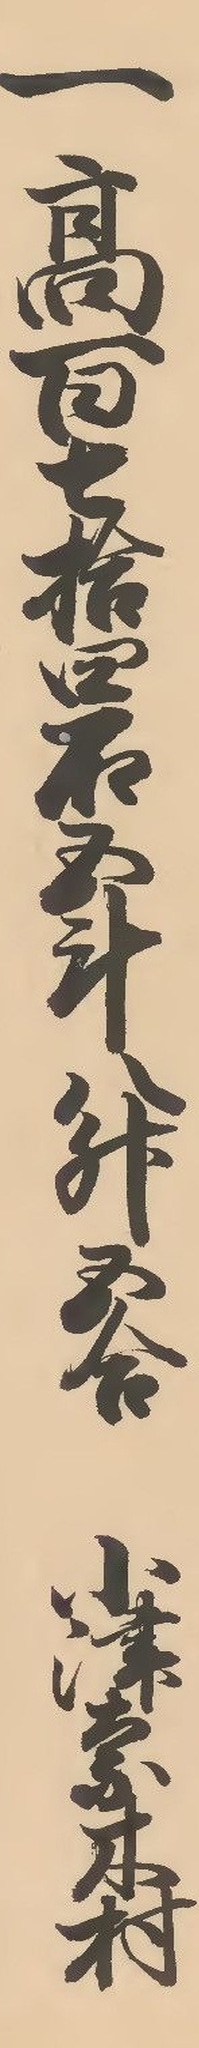一髙百七拾四石五斗八升五合小津奈木村
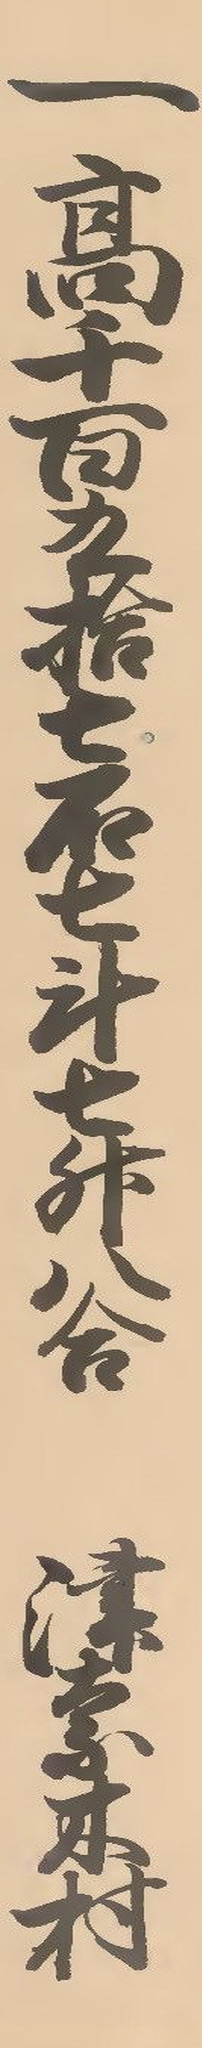一髙千百九拾七石七斗七升八合津奈木村
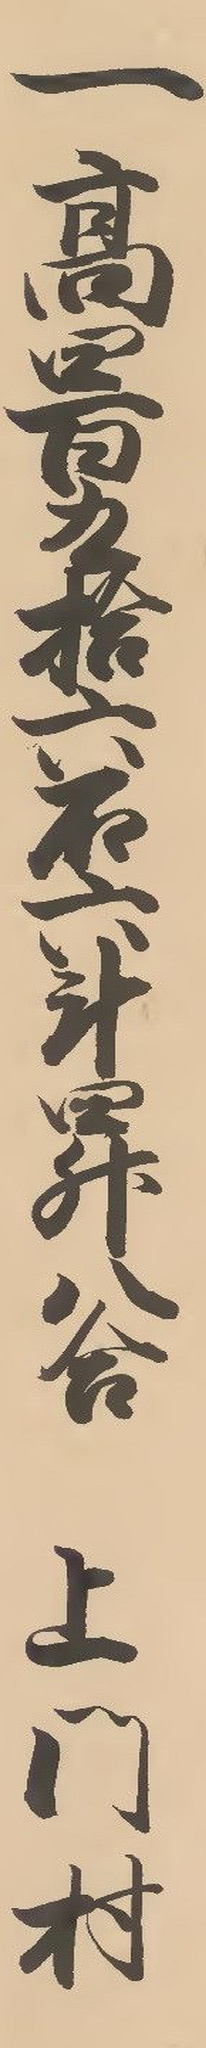一髙四百九拾六石六斗四升八合上門村
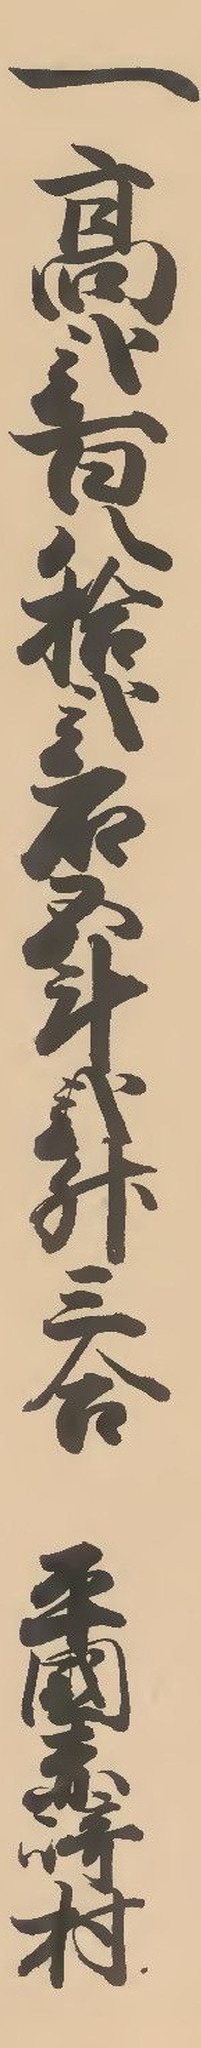一た弐百八拾弐石五斗壱升三合平國赤崎村
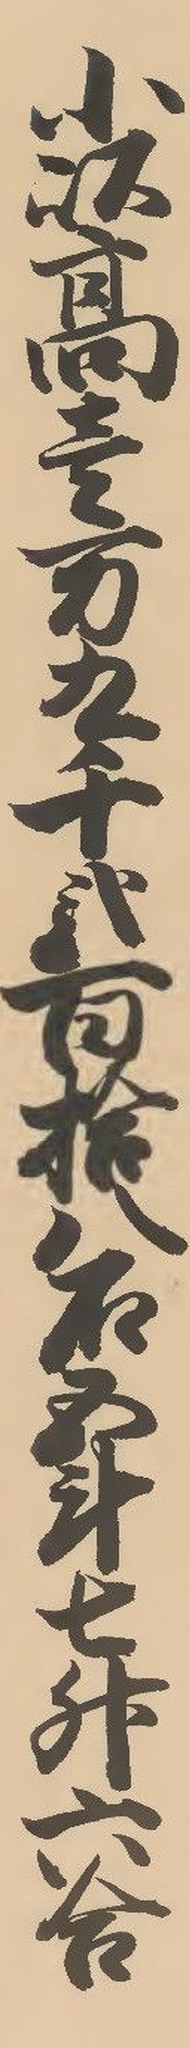小以髙壱万九千弐百拾八石五斗七升六合

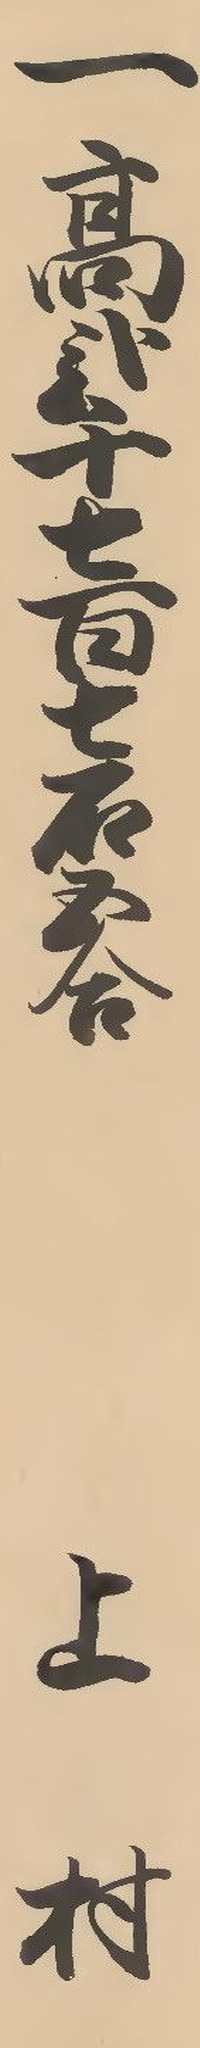一髙弐千七百七石五合上村
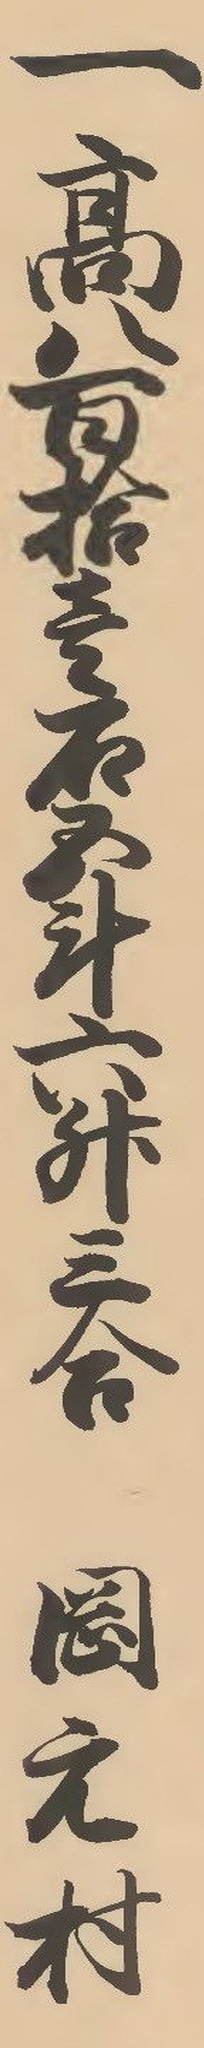一髙八百拾壱石五斗六升三合岡元村
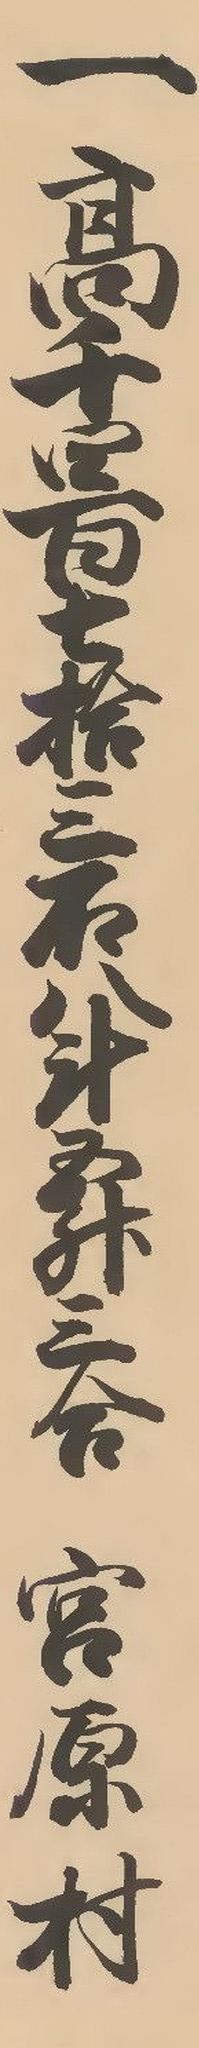一髙千四百七拾三石八斗五升三合宮原村

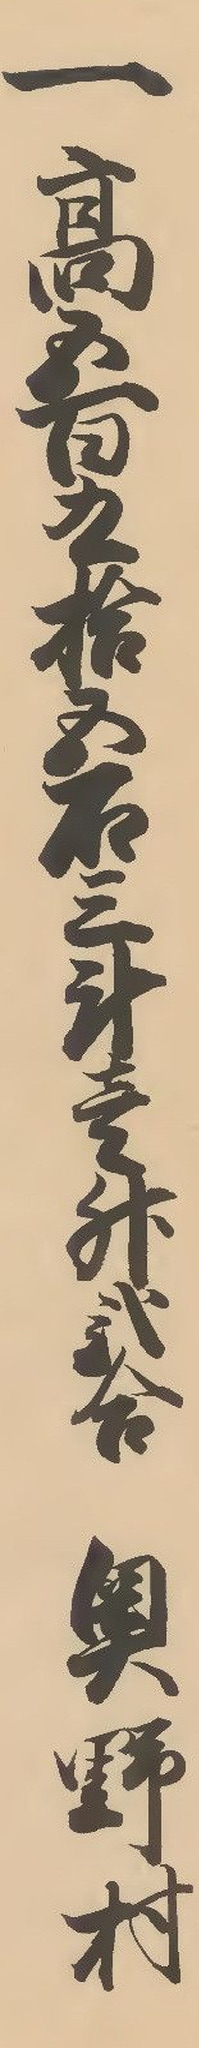一髙五百九拾五石三斗壱升弐合奥野村
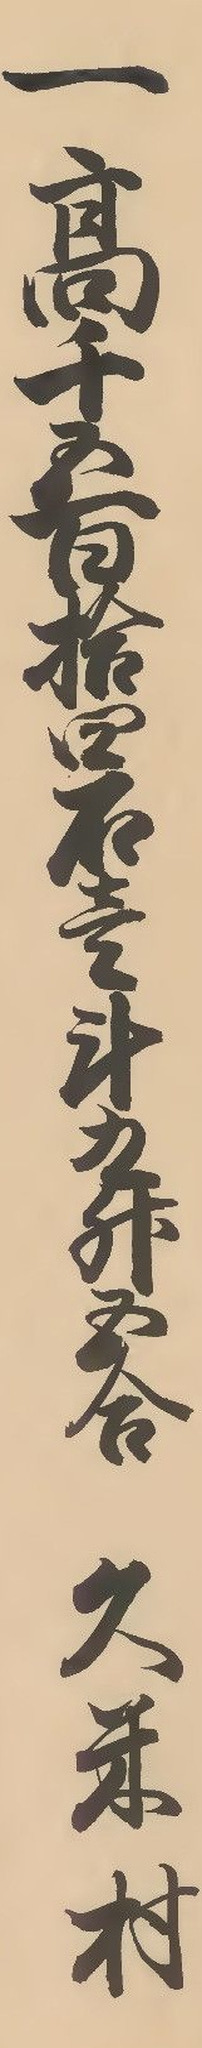一髙千五百拾四石壱斗九升五合久米村
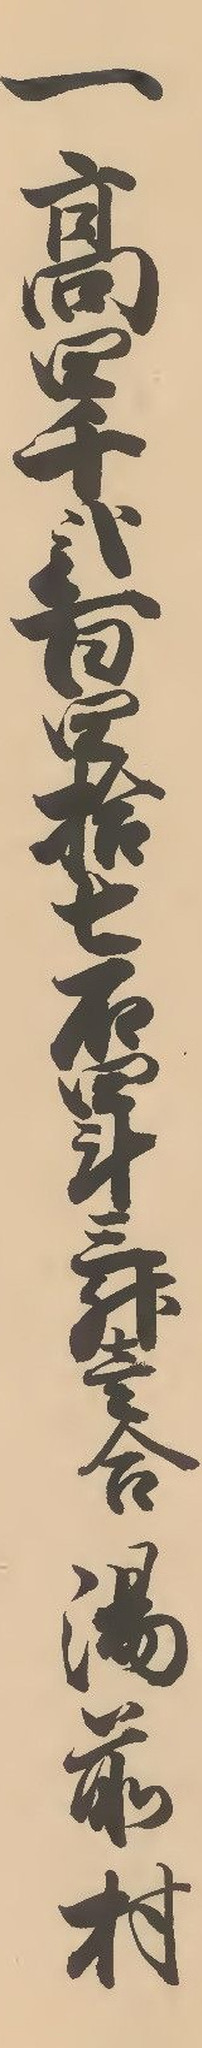一髙四千弐百四拾七石四斗三升壱合湯前村
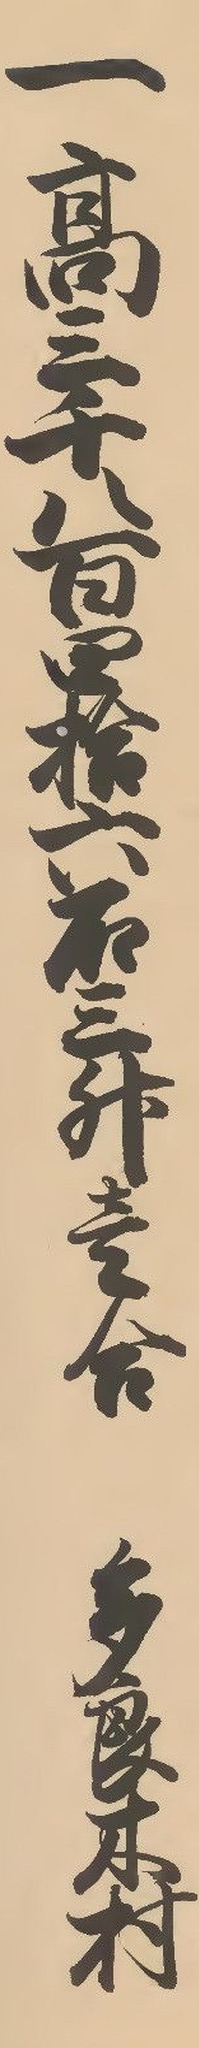一髙三千八百四拾六石三升壱合多良木村
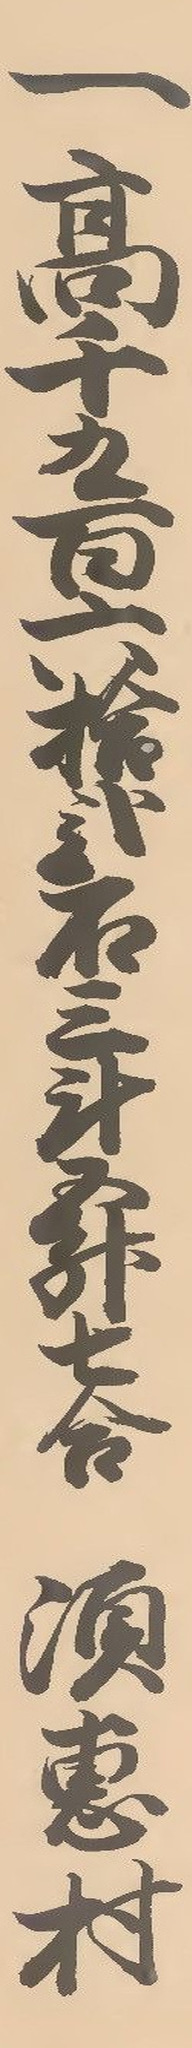一髙千九百六拾弐石三斗五升七合須恵村
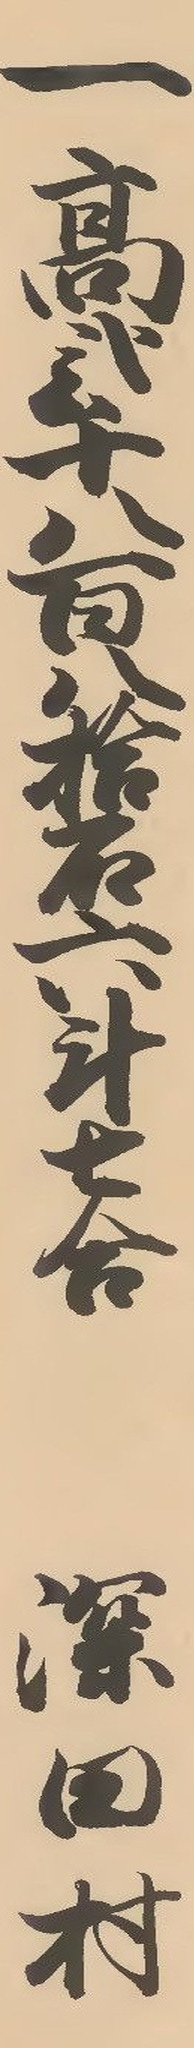一髙二千八百八拾石六斗七合深田村
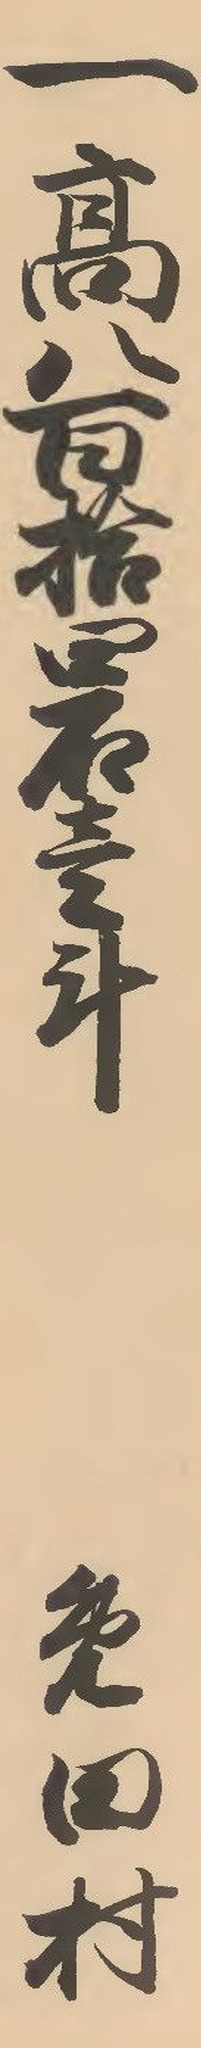一髙八百拾四石壱斗免田村
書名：肥後国郷帳
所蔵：国立公文書館 National Archives of Japan
